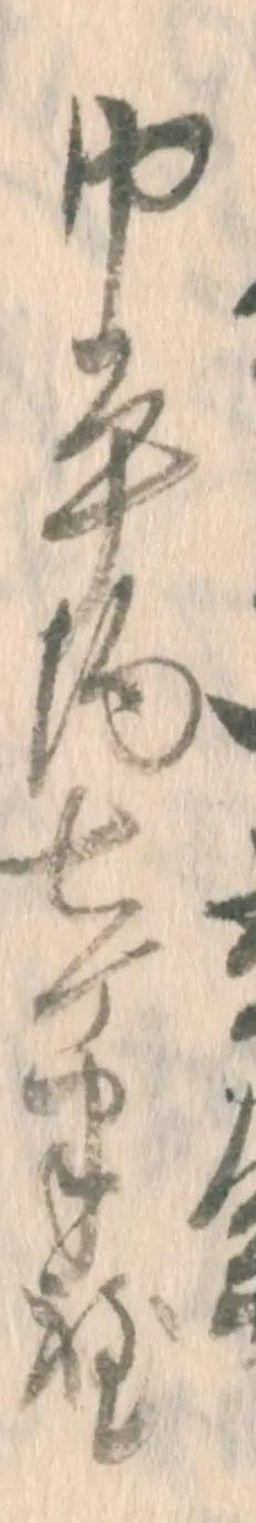幅平均七丁半程
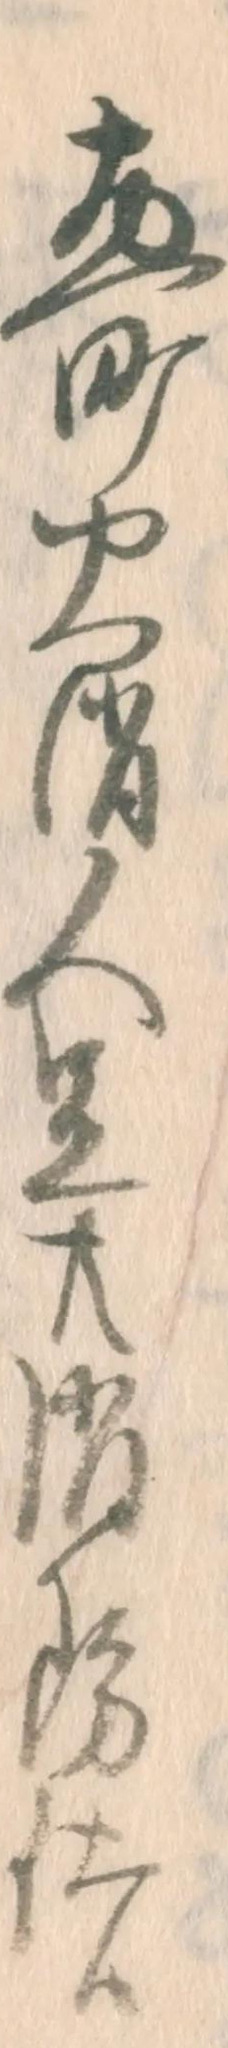一惣町火消人足共消防仕候
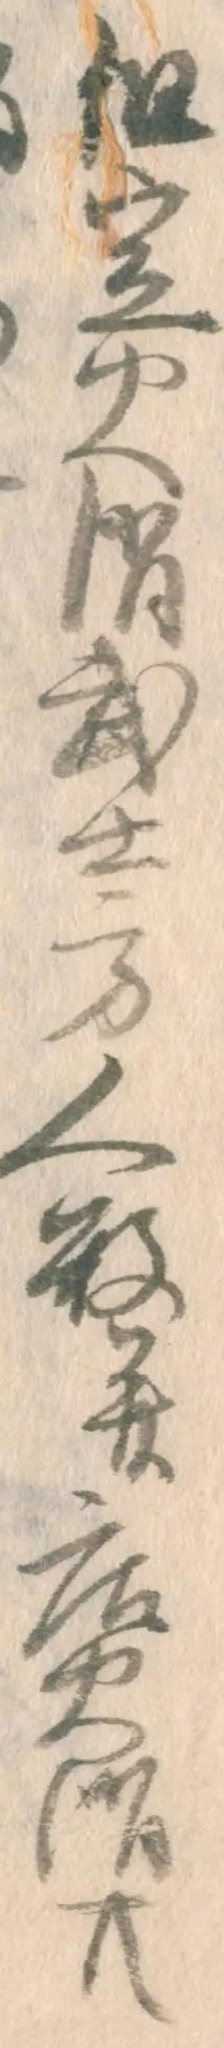但定火消武士方人数幷店火消共
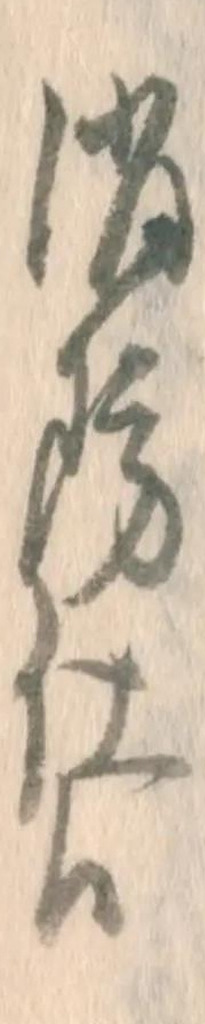消防仕候

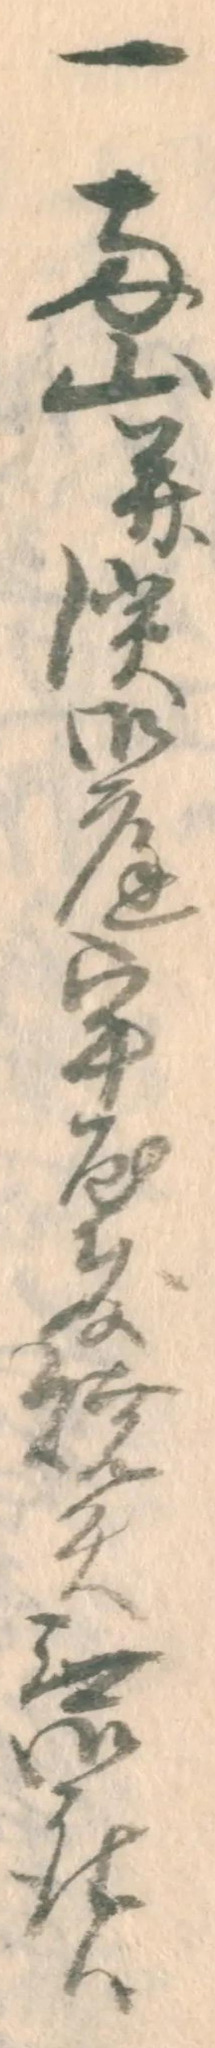一両山幷浜御庭牢屋敷焼失無御座候
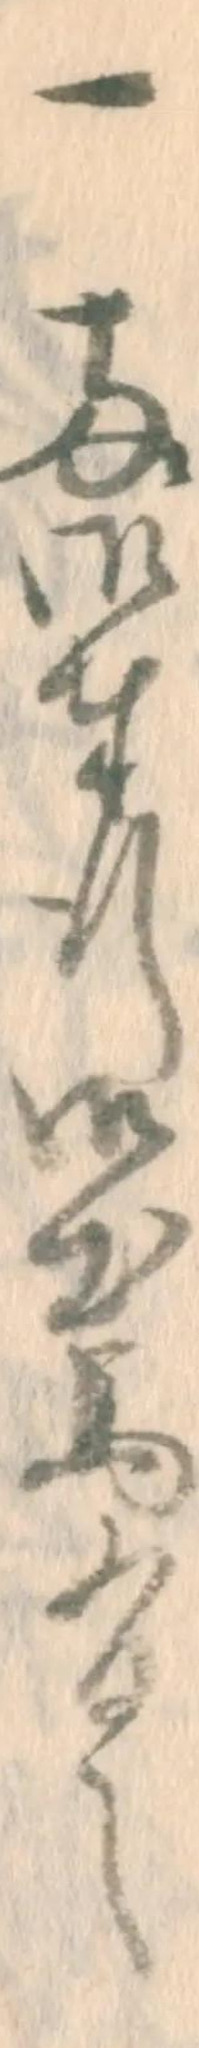一両御奉行御出馬有之
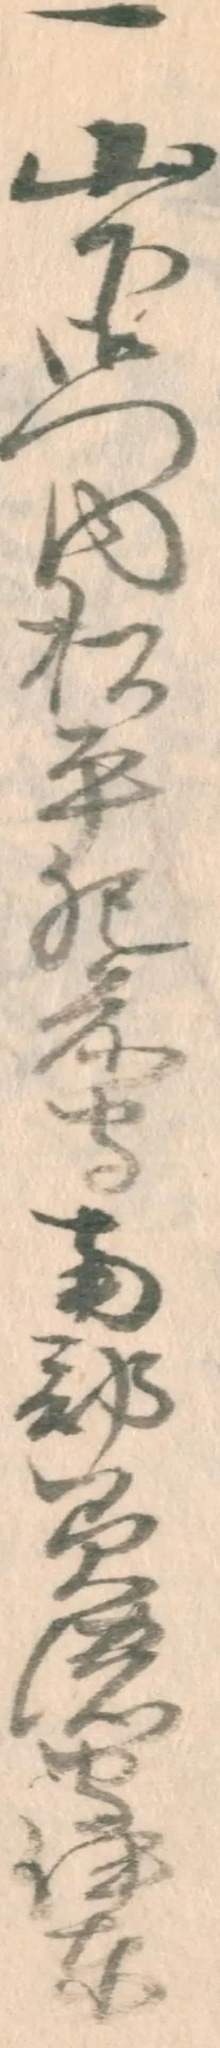一山下御門内松平肥前守南部美濃守伊東
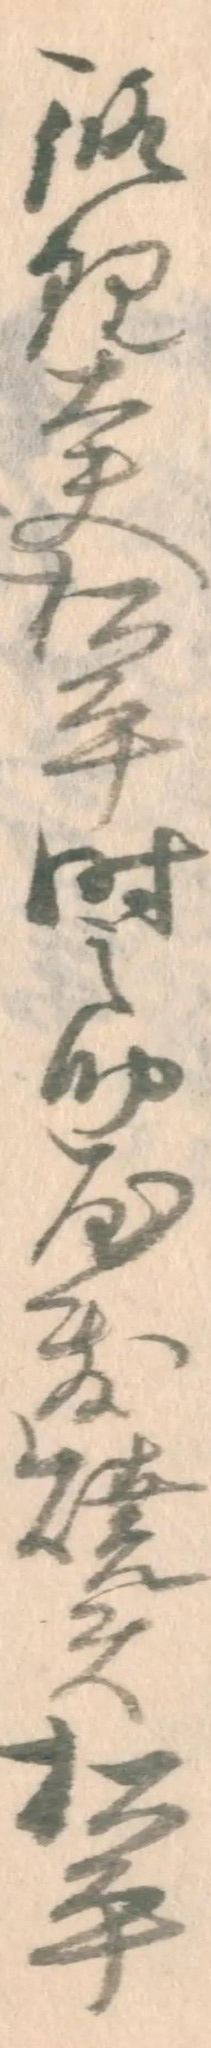修理大夫松平時之助屋敷焼失松平
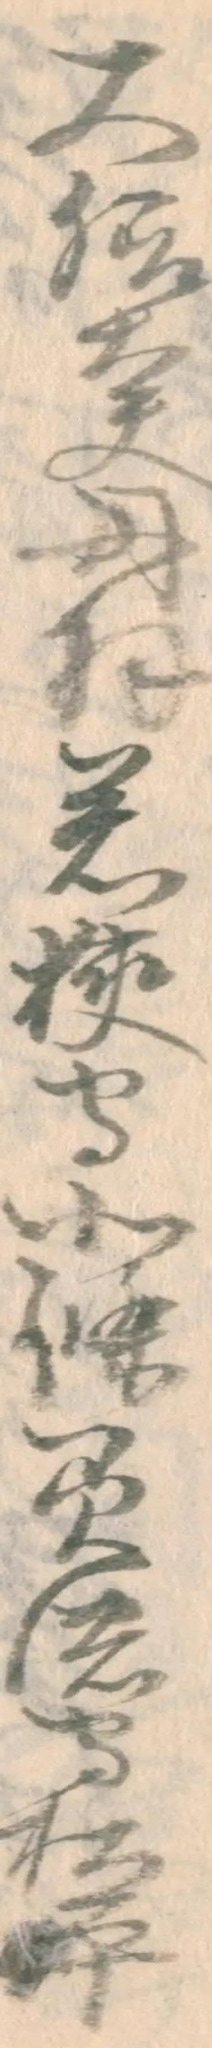大膳大夫丹羽若狭守北条美濃守松平
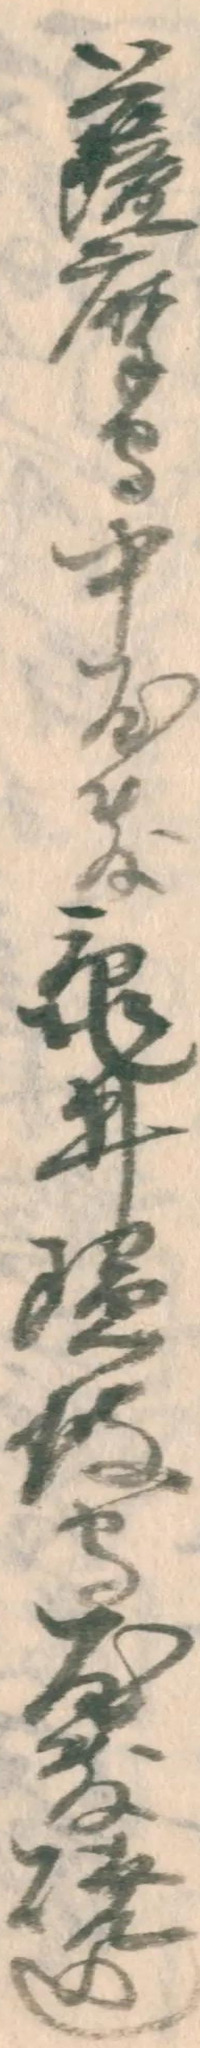薩摩守中屋敷亀井隠岐守屋敷焼込
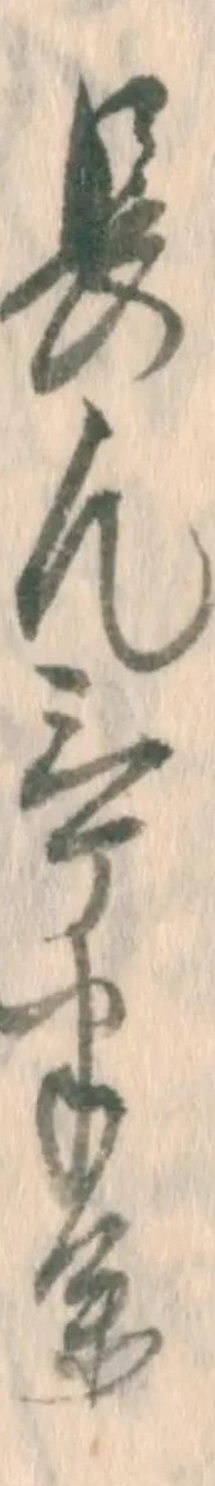長凡三丁半余
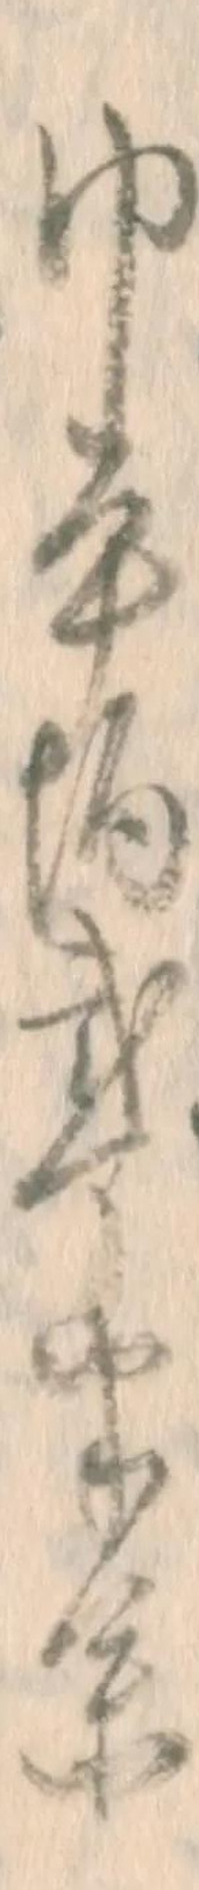幅平均弐丁半余
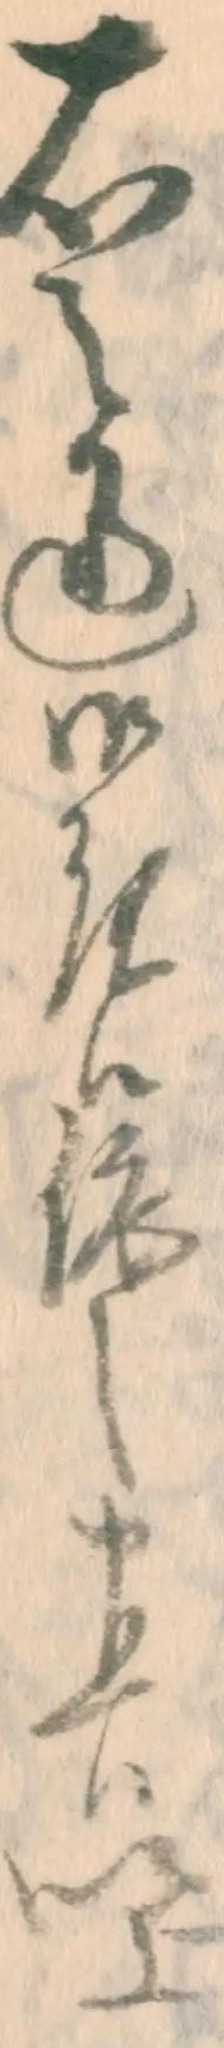右之通御御座候依之申上候以上
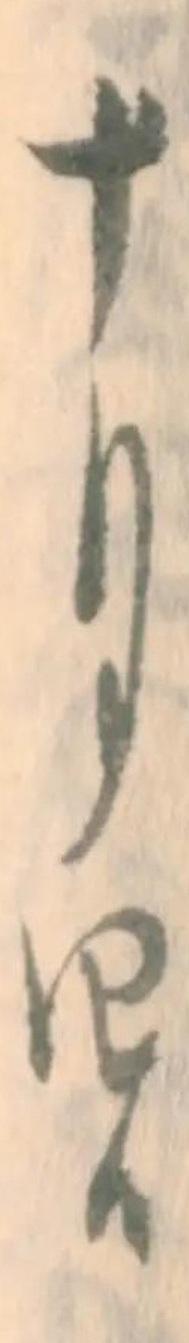十月四日

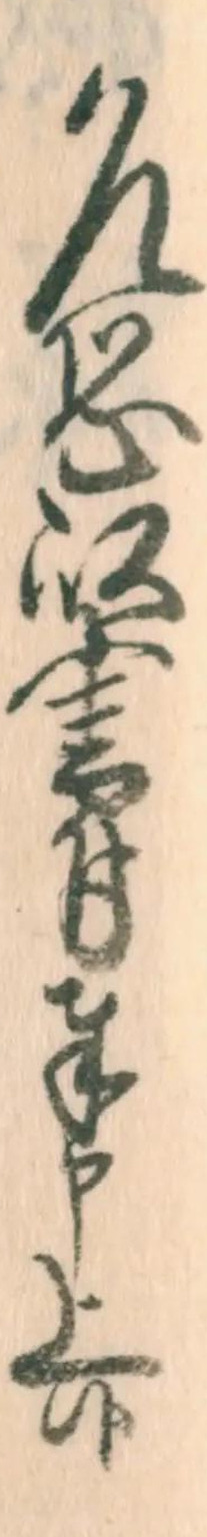乍恐以書付奉申上候
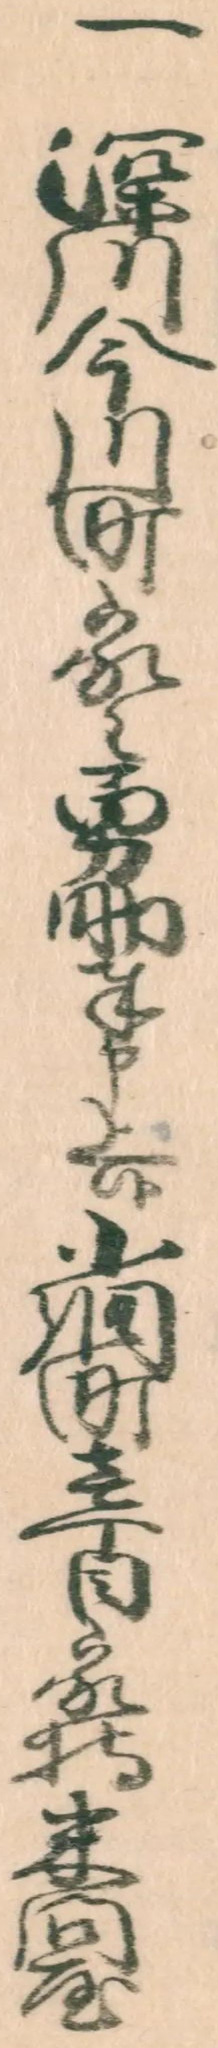一深川今川町家主勇助奉申上候小網町壱丁目家持米問屋
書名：地震災書留 2巻. [1] 内表紙に「地震災書留　安政二卯年　但本所深川御用屋敷地代免除調」とあり
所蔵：国立国会図書館 National Diet Library, JAPAN
